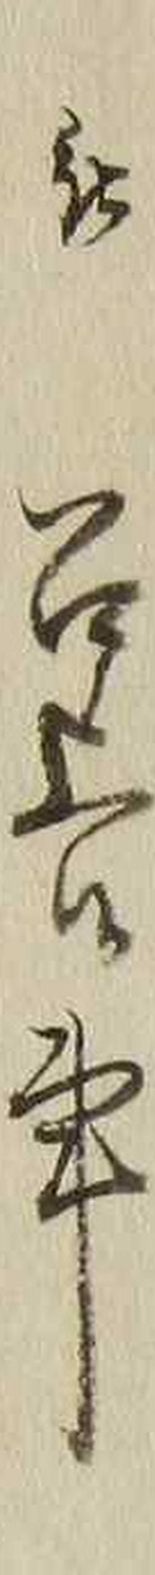被召上候事
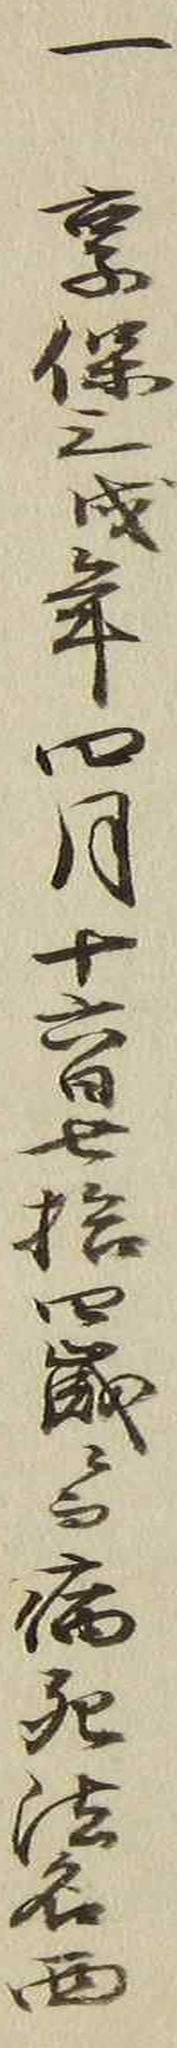一享保三戌年四月十六日七拾四歳ニ而病死法名西
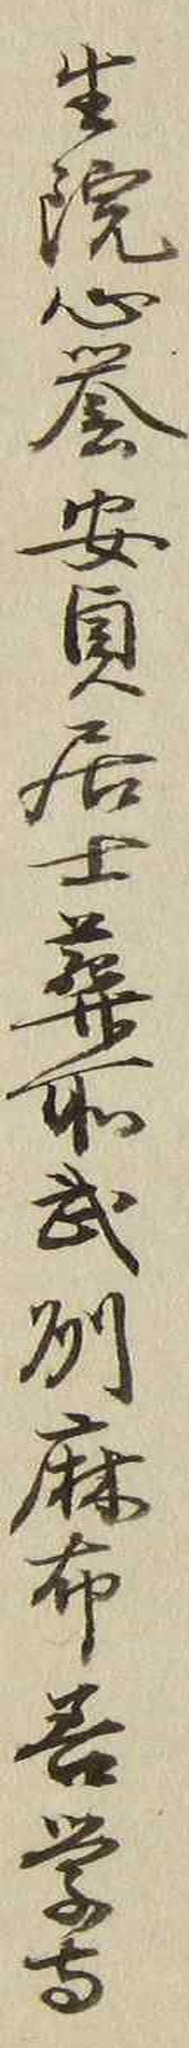生院心誉安貞居士葬所武州麻布善学寺

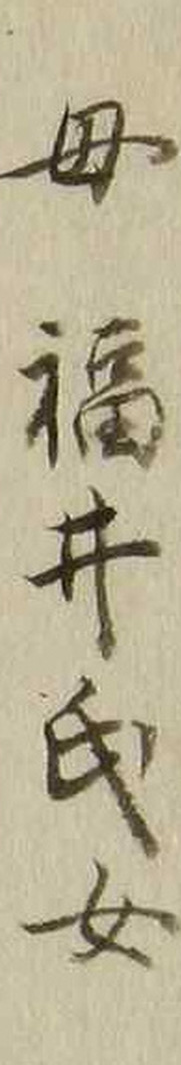母福井氏女
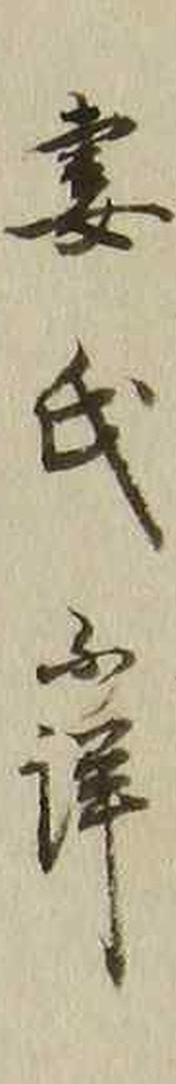妻氏ふ詳
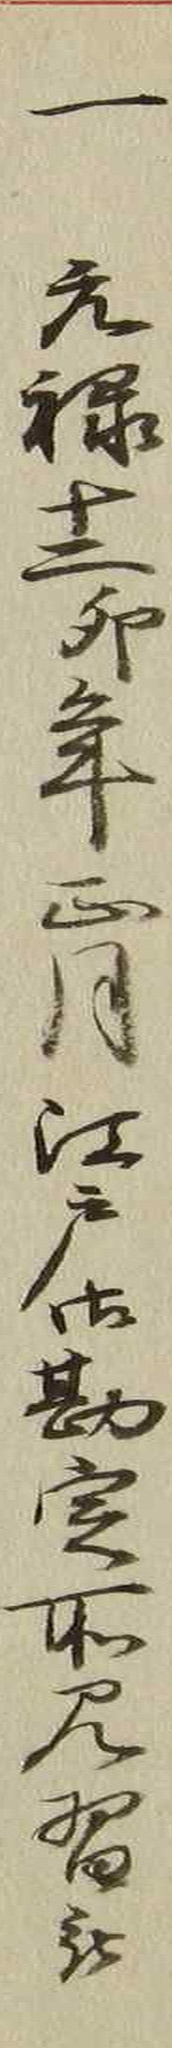一元禄十二夘年正月江戸御勘定所見習被
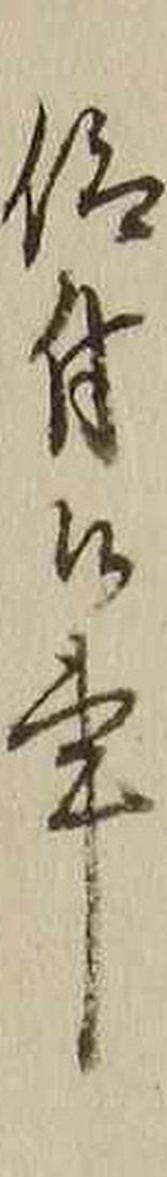仰付候事
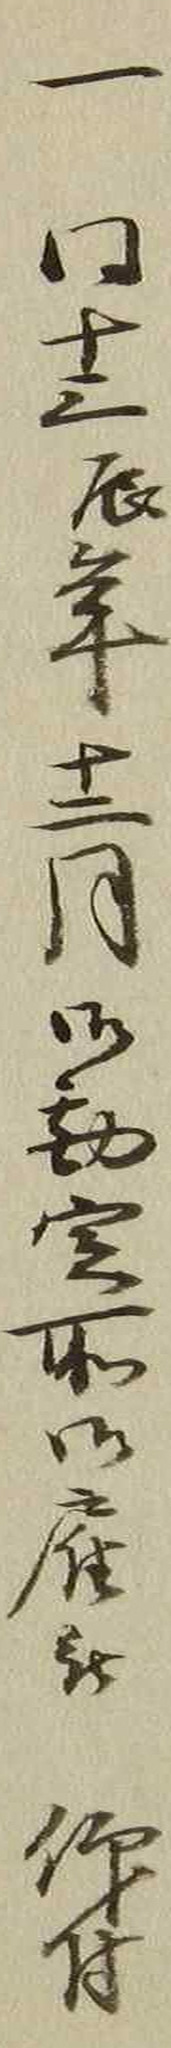一同十三辰年十二月御勘定所御雇被仰付
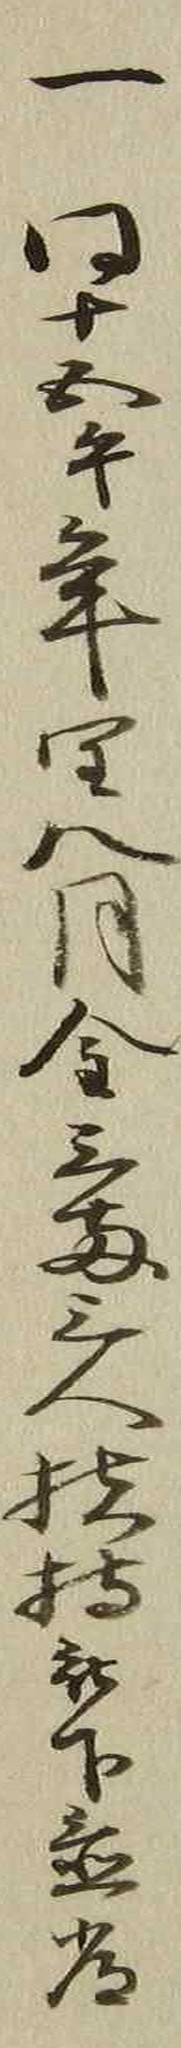一同十五午年閏八月金三両三人扶持被下置常
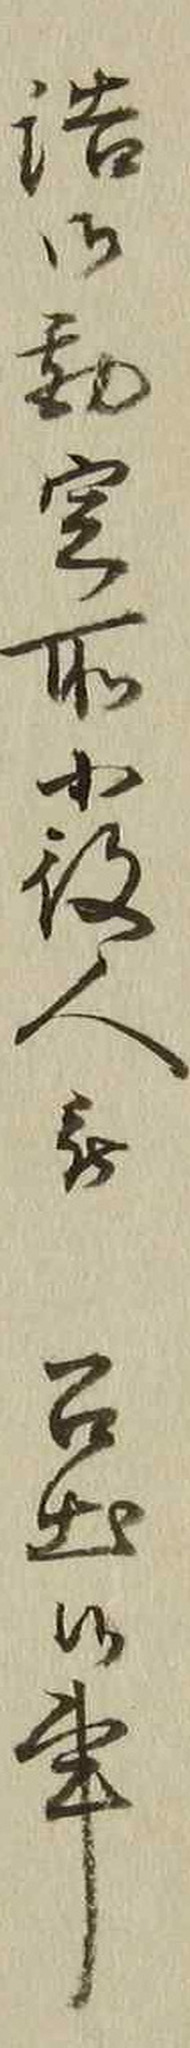詰御勘定所小役人被召出候事
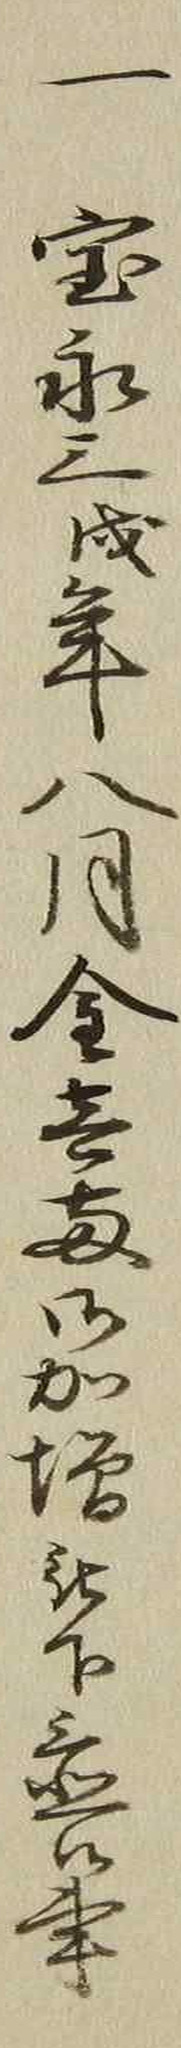一宝永三戌年八月金壱両御加増被下置候事
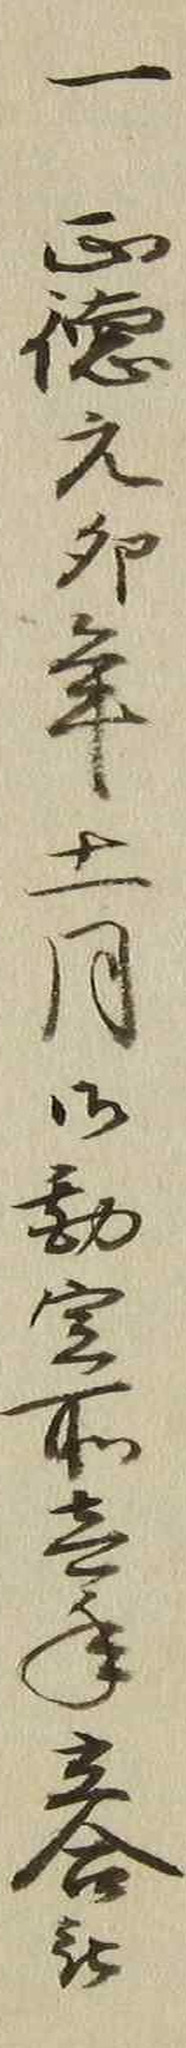一正徳元夘年十一月御勘定所壱年立合被
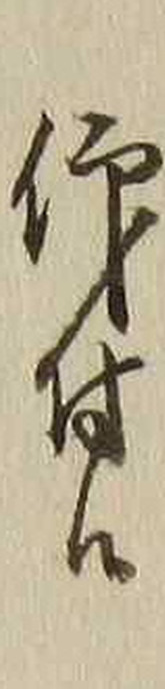仰付候
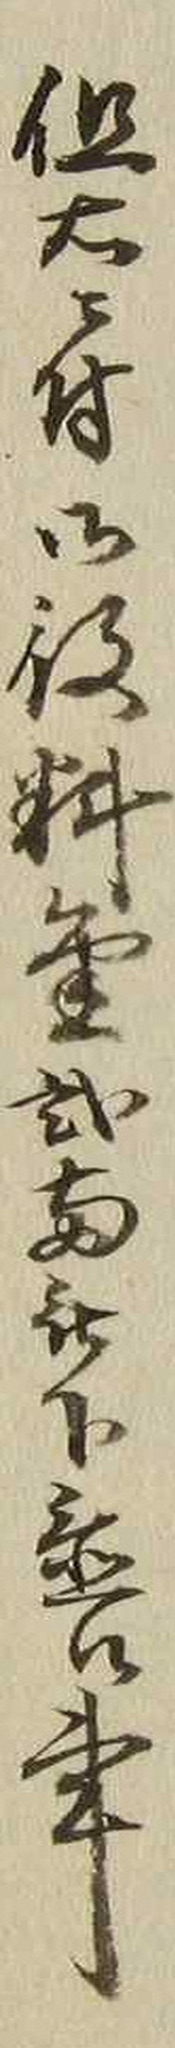但右ニ付御役料金弐両被下置候事
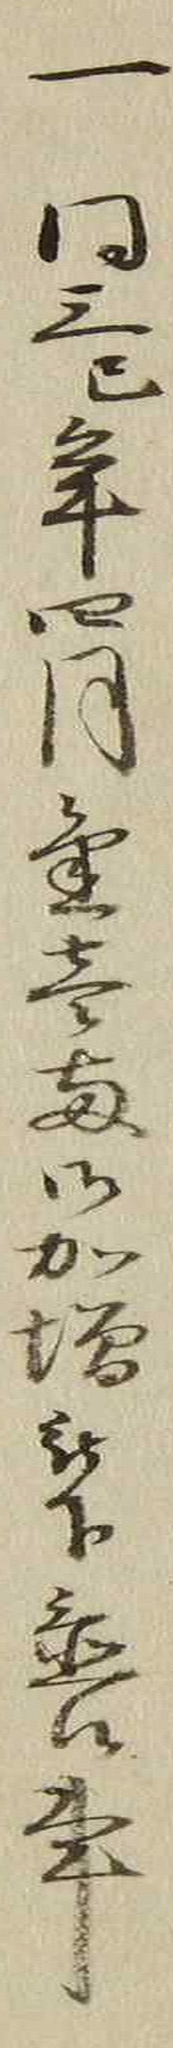一同三巳年四月金壱両御加増被下置候事
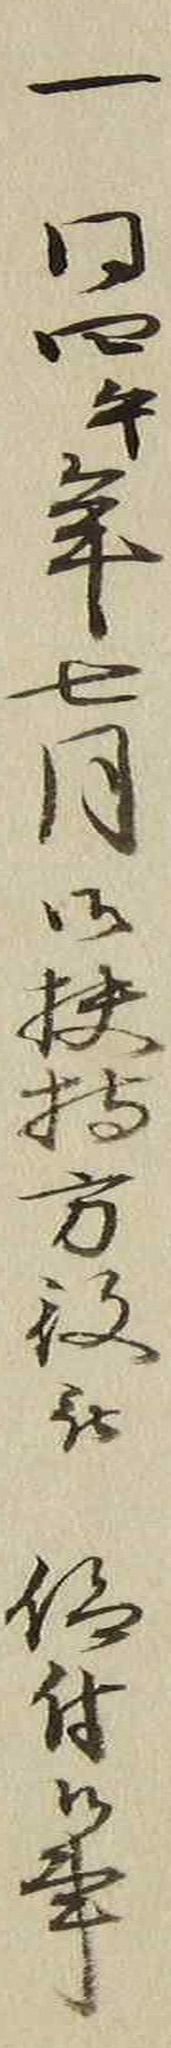一同四午年七月御扶持方役被仰付候事
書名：諸士系譜　巻之114　か之部22
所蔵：会津若松市立会津図書館
